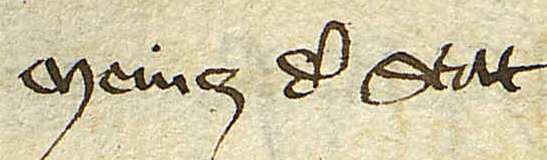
Meincʒ d* Stat
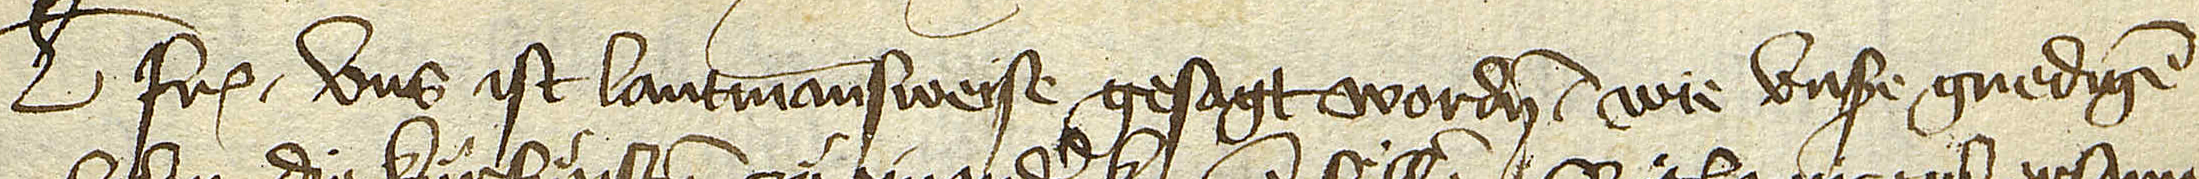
L* fr* / vns iſt lantmanſweiſe geſagt wordn* / wie vnſ*e gnedige*
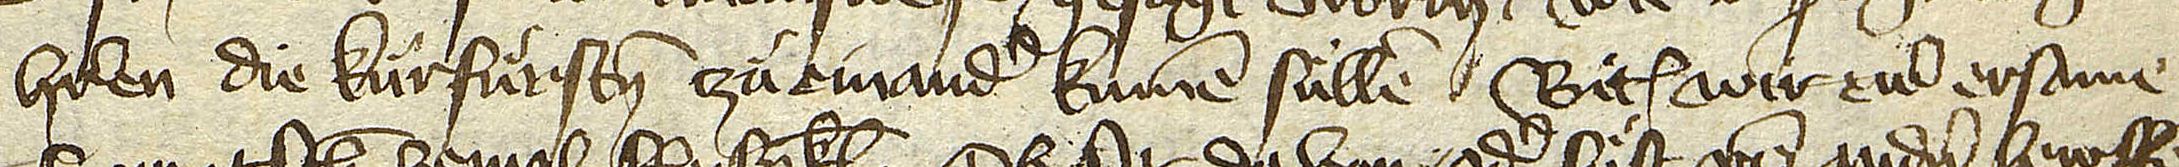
hr*en die kürfürſtn* cʒü einand* kume* ſülle* / Bit* wir ew* erſame
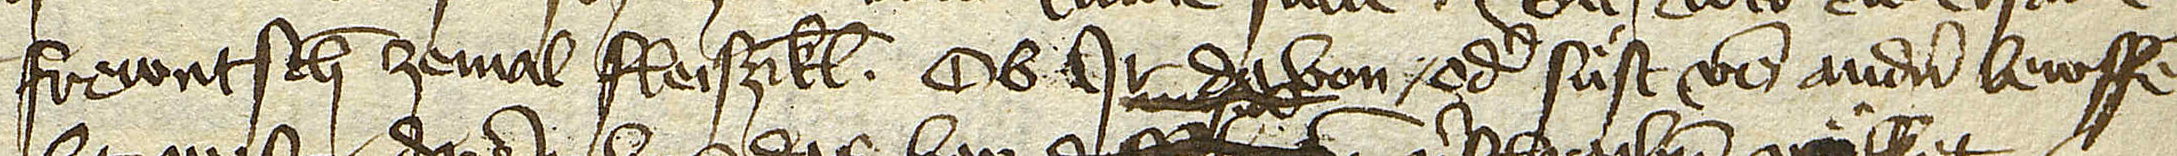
frewntſch* cʒemal fleiſʒikl*. Ob Ir davon / od* ſüſt vo* andn* lewſſe*
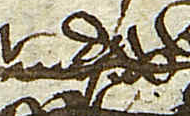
%%%%%%
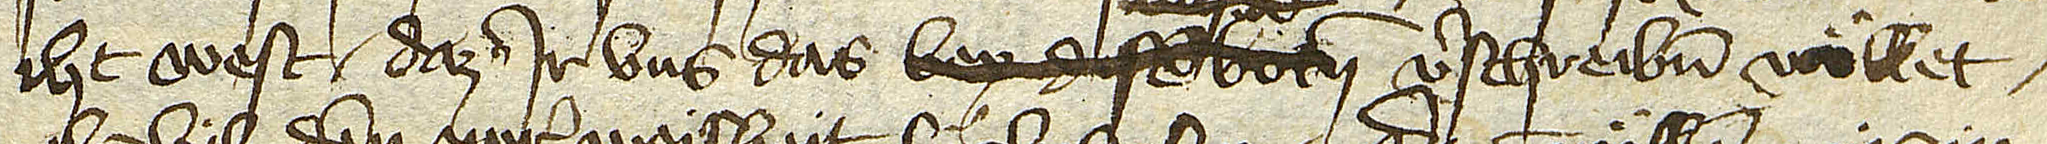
iht weſt / daʒ Ir vns das bey diſe* botn* v*ſchreibn* wöllet /
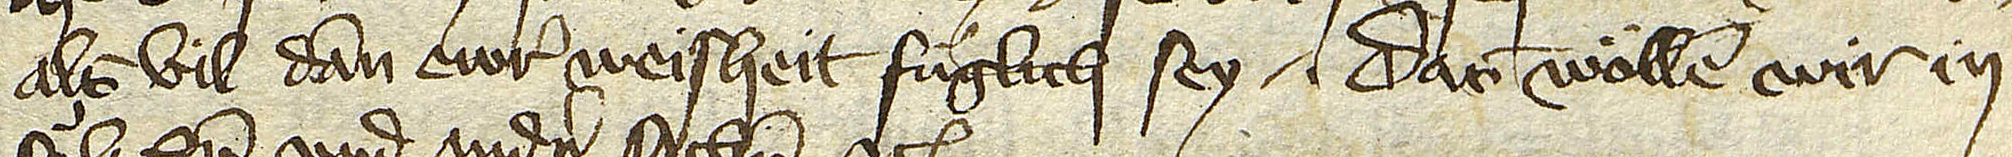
als vil dan* ewr* weiſheit füglich ſey / . Das wölle* wir in
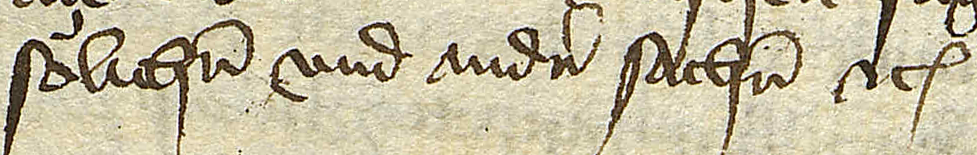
ſölichn* vnd andn* ſachn* ec*
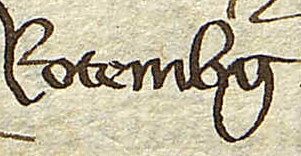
Rotemb*g
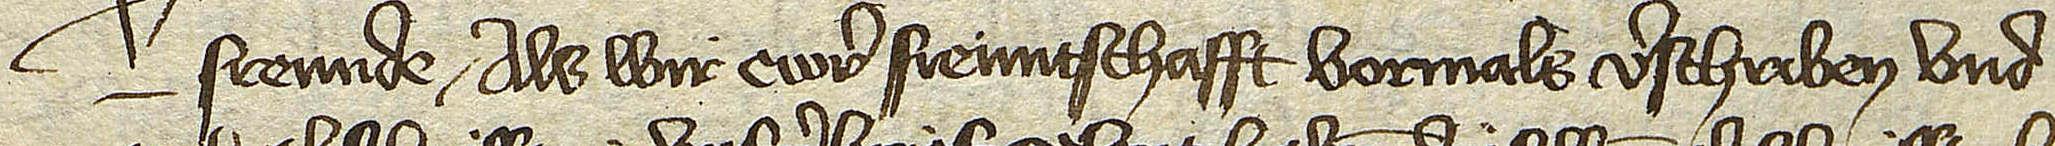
L* freunde / Als wir ewr* freuntſchafft vormals v*ſchriben vnd
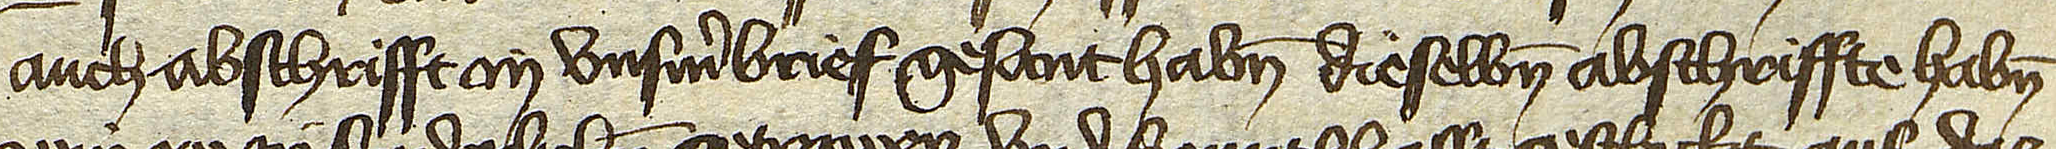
auch abſchrifft in vnſm* brief geſant habn* dieſelbn* abſchriffte habn*
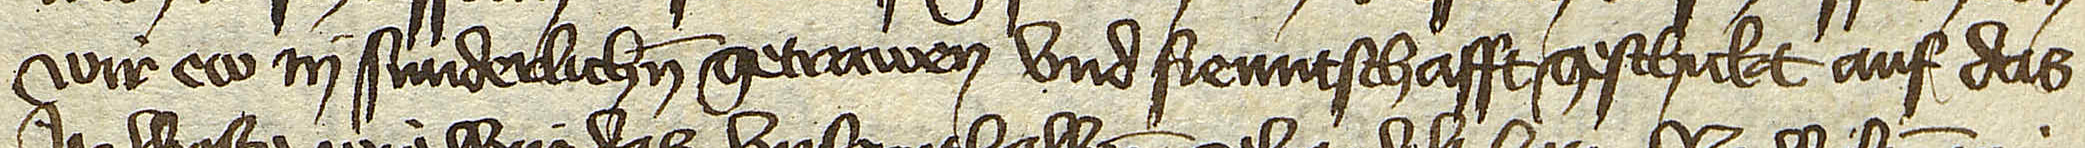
wir ew in ſunderlichn* getrawen vnd freuntſchafft geſchickt auf das
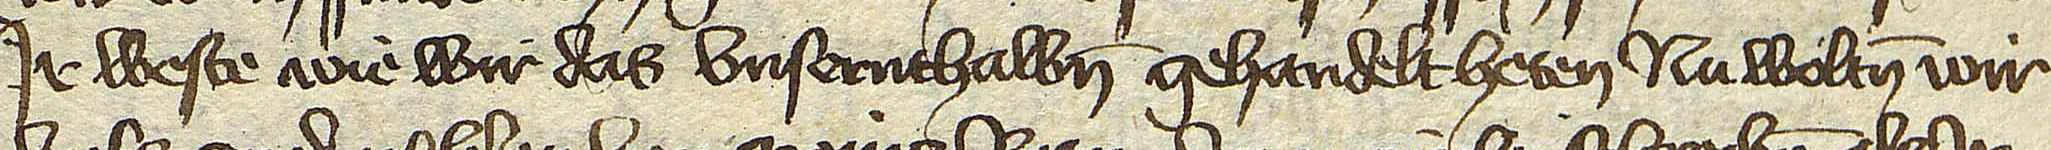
Ir weſte wie wir das vnſernthalbn* gehandelt heten Nu woltn* wir
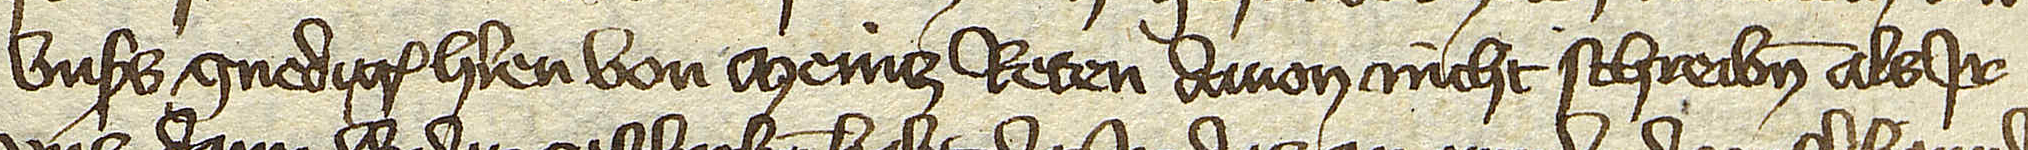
vnſ*s gnedig* hr*en von Meincʒ Reten dauon nicht ſchreibn* als Ir
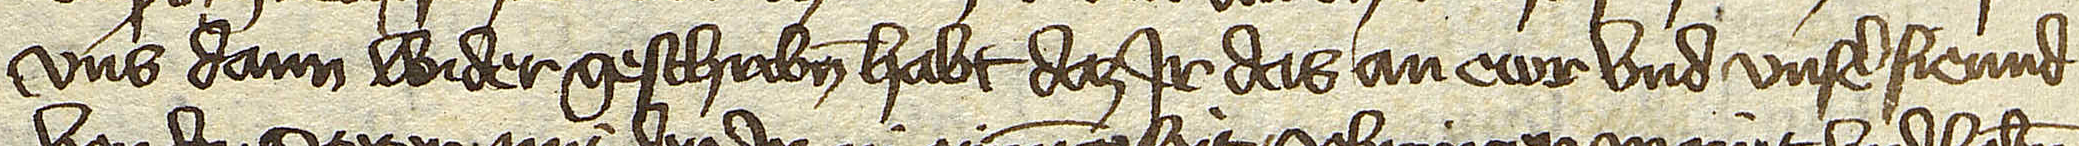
vnd dann wider geſchribn* habt daʒ Ir das an ewr vnd vnſe* freund
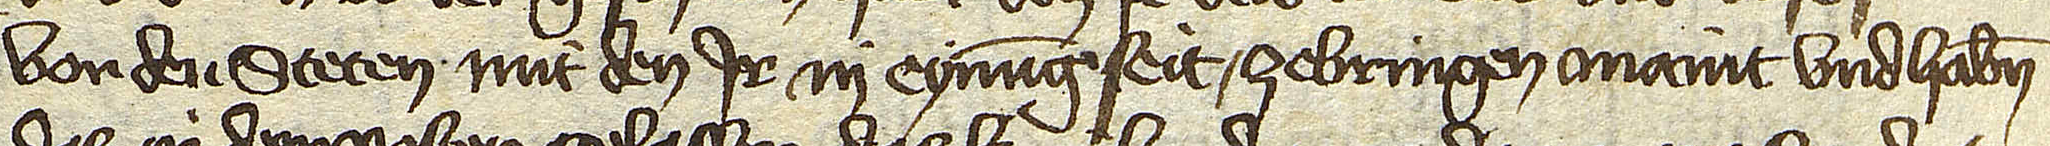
von den Steten mit den Ir in eynug* ſeit / cʒebringen maint vnd habn*
